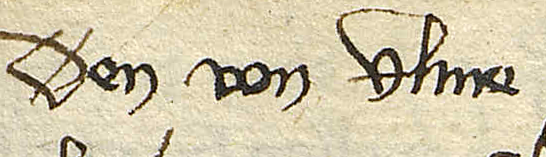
Den von Vlme
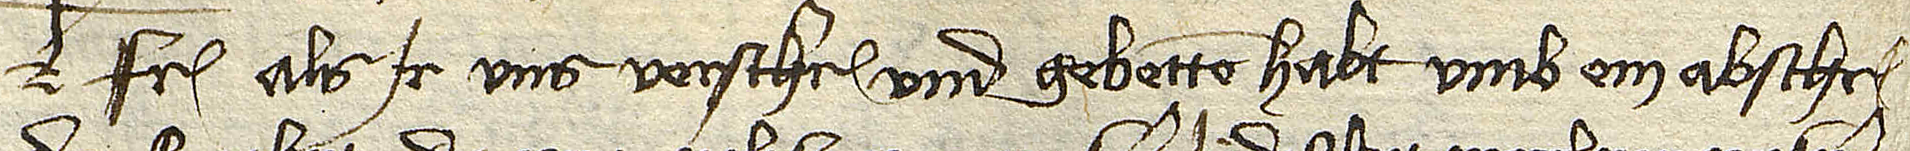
L* fr* als Ir vns verſchr* vnd gebette* habt vmb ein abſchr*
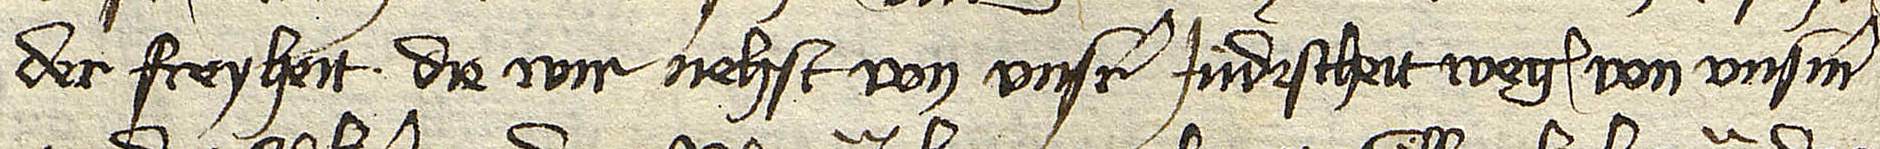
der freyheit . die wir nehſt von vnſr* Iüdiſcheit weg* von vnſm*
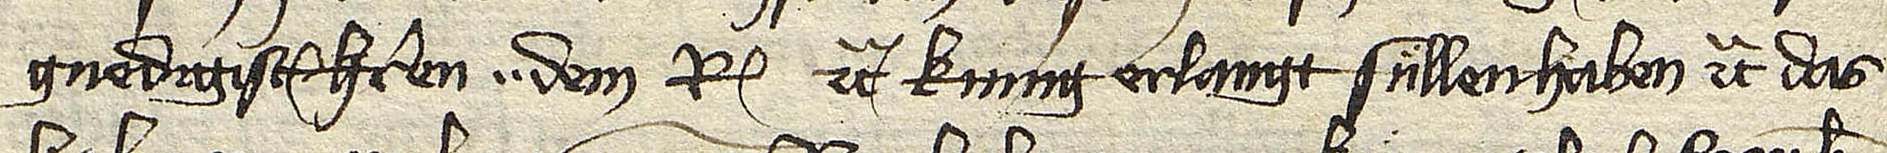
gnedigiſt* hren* ~ dem R* ec* kunig erlangt ſüllen haben ec* das
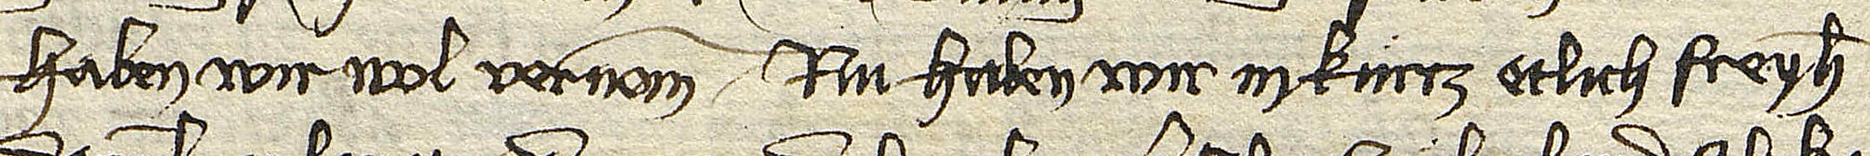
haben wir wol vernom* / Nu haben wir in kürcʒ etlich freyh*
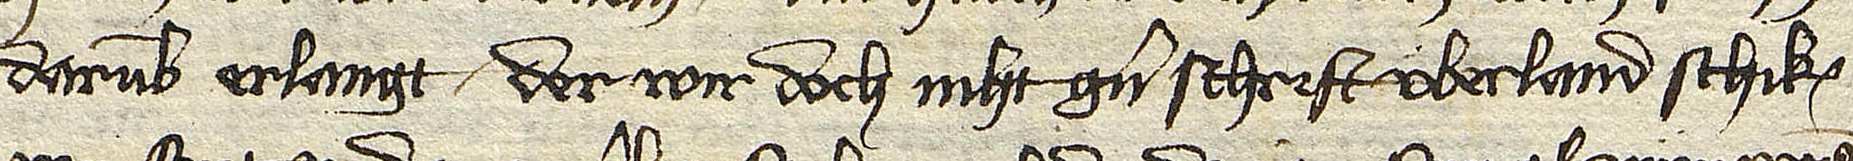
darub* erlangt / der wir doch niht gn* ſchrift v̈berland ſchik*
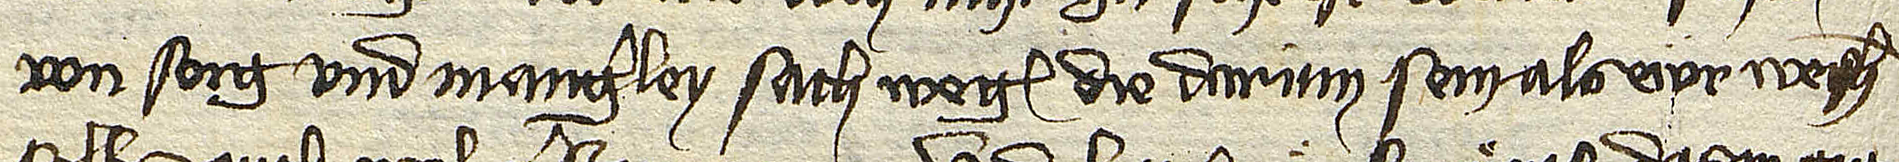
von ſorg vnd mangley* ſach weg* die darinn ſein als ewr weiſ*
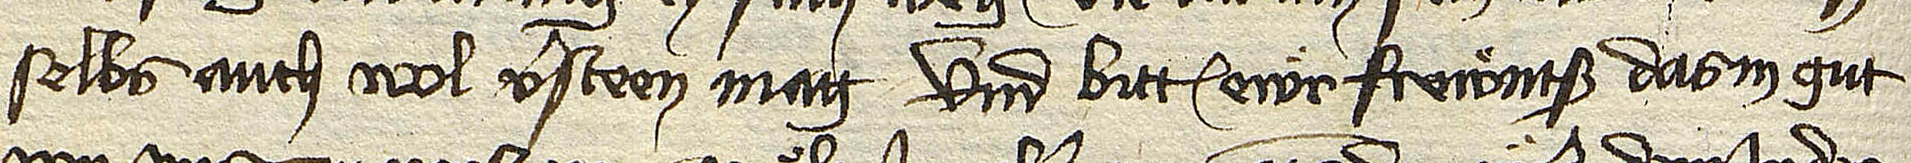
ſelbs auch wol v*ſteen mag / Vnd bitt* ewr frewntl* das in gut
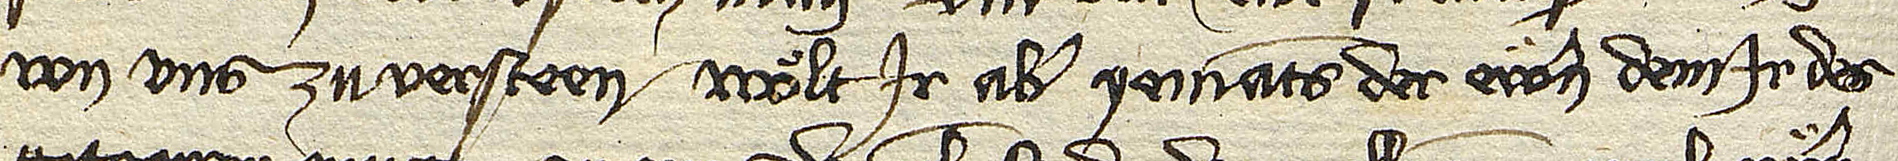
von vns ʒu verſteen / wölt Ir ab* yemats* der ewn dem Ir des
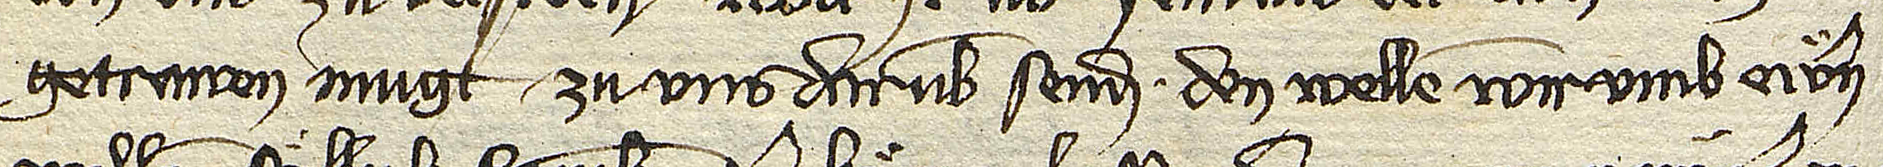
getrawen mugt / ʒu vns darub* ſend . den welle* wir vmb ewn*
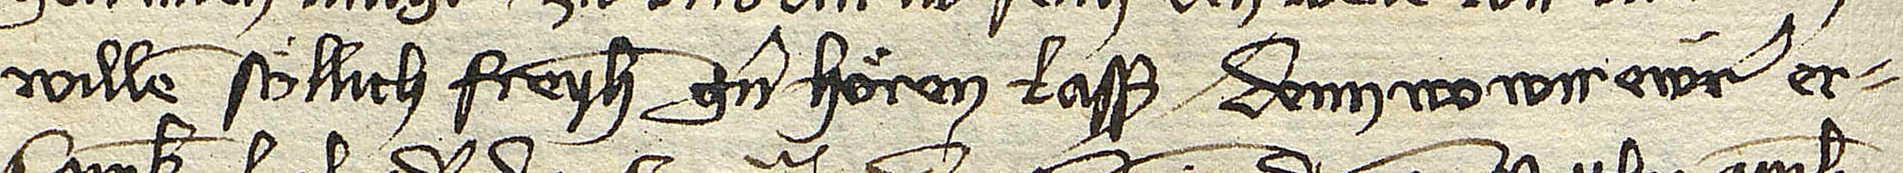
wille* ſöllich freyh* gn* hören laſſ* / Denn wo wir ewr er =
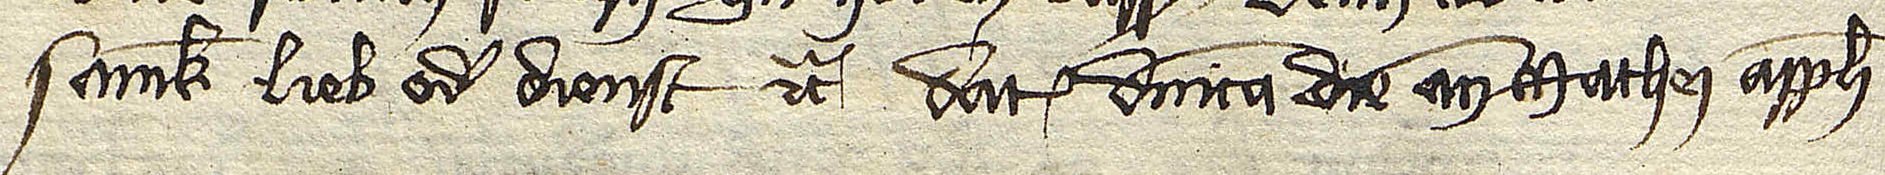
ſamk* lieb od* dienſt ec* Dat* dnica* die an* Mathei appli*
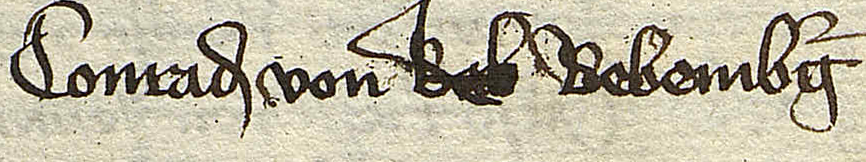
Conrad* von Bab Bebembg*
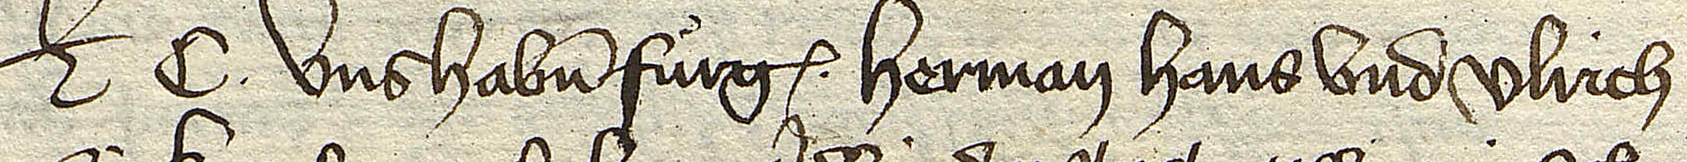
L* C . Vns habn* fürg* . herman hans vnd Vlrich
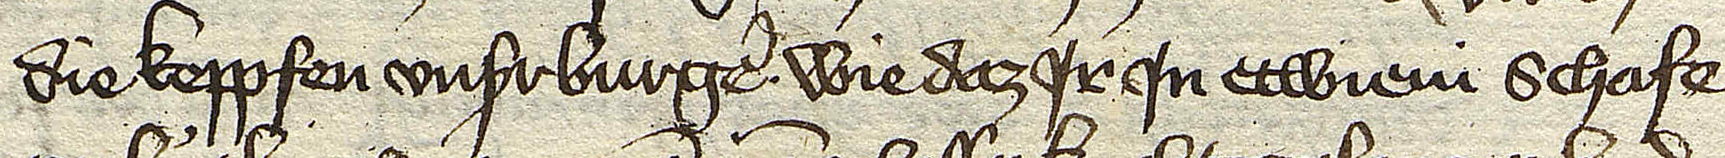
die keppfen vnſr* burge* . wie daʒ Ir In etwieui Schafe
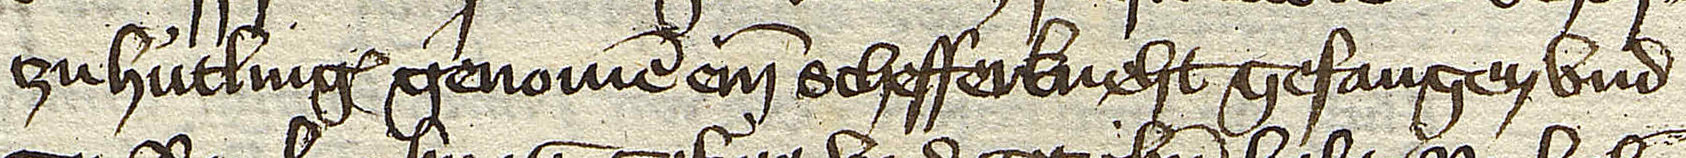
cʒu hütling* genome* ein* Schefferkneht gefangen vnd
